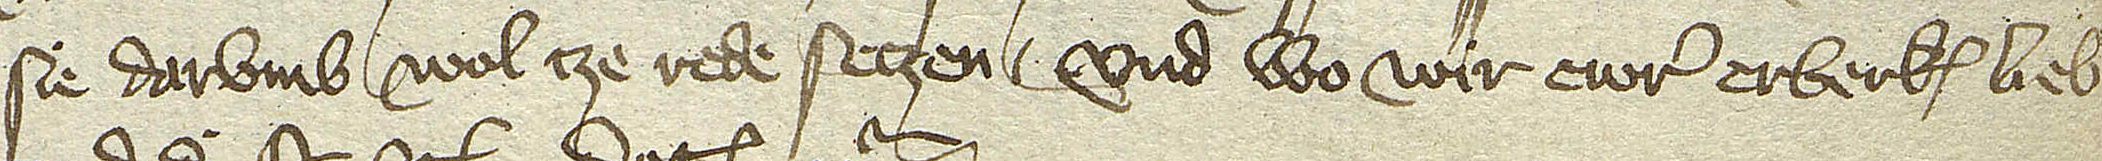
ſie darvmb wol cʒe rede ſecʒen / vnd wo wir ewr* erberk* lieb
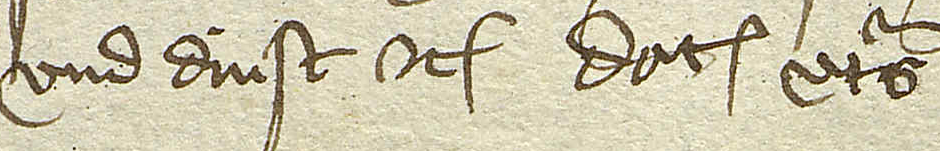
vnd dinſt ec* dat* vts*
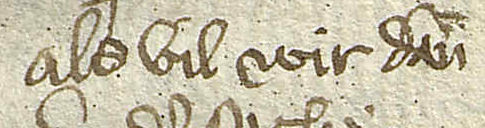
als vil wir dan*
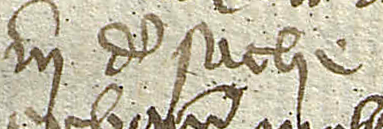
in* d* ſache
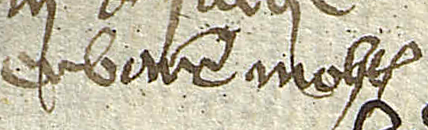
ervare* moht*
